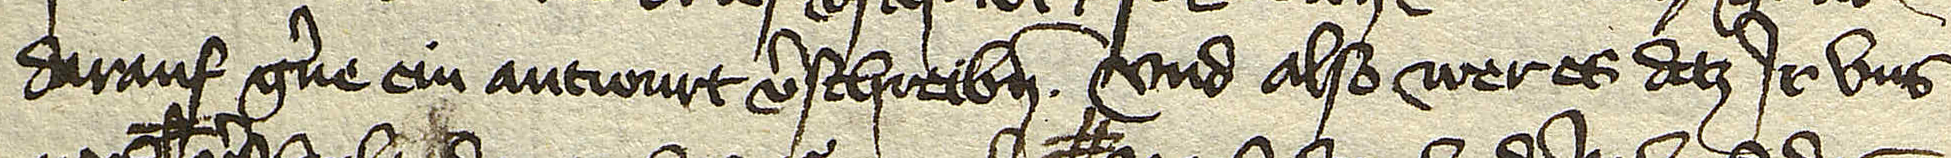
darauf g*ne ein antwurt v*ſchreibn* . vnd alſo wer es daʒ Ir vns
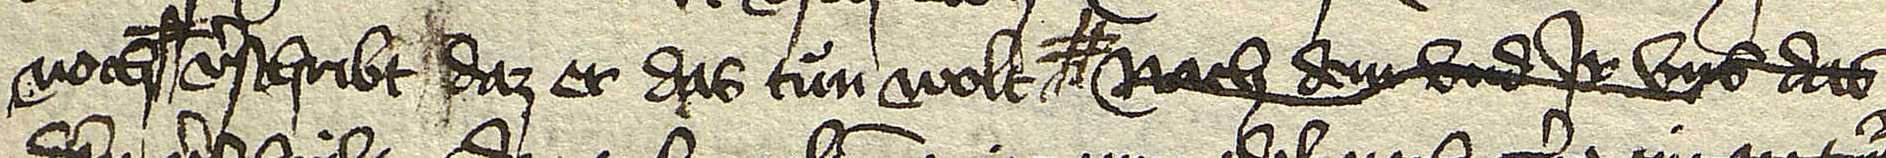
noch v*ſchribt daʒ er das tün wolt Nach dem vnd Ir vns das
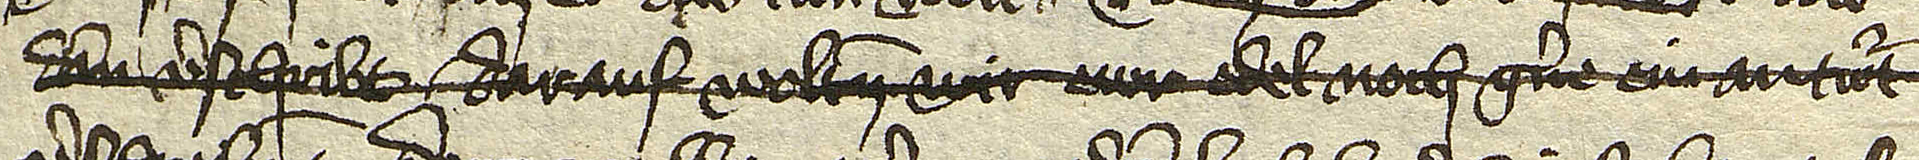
dan* v*ſchribt / darauf woltn* wir ewr edel noch g*ne ein antw*t
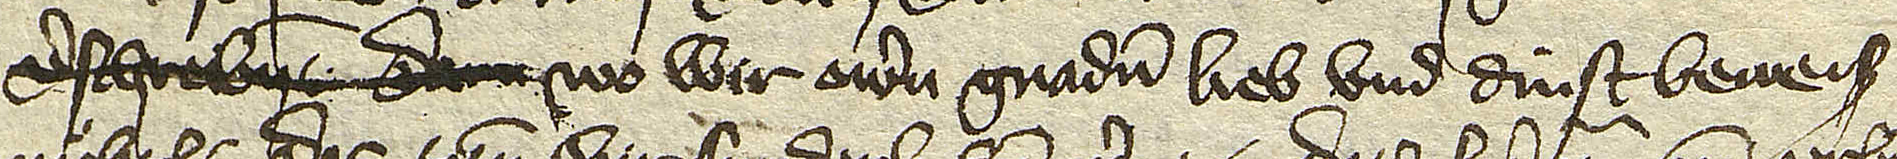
v*ſchreibn* / . Dann wo wir ewn* gnadn* lieb vnd dinſt beweiſ*
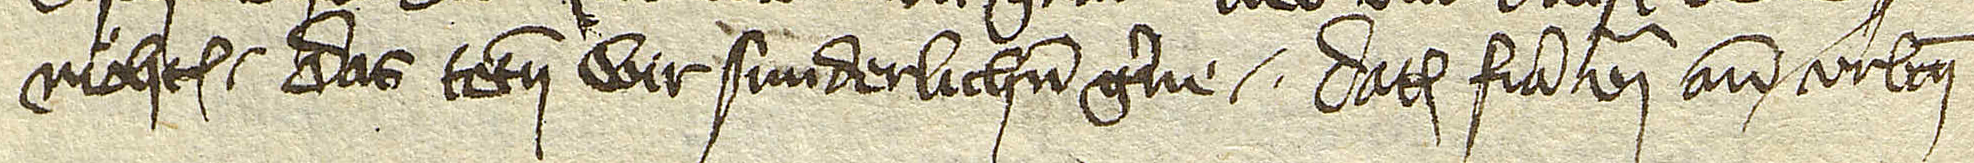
möht* / Das tetn* wir ſunderlichn* g*ne / . dat* fia* vi* an* vrbai*
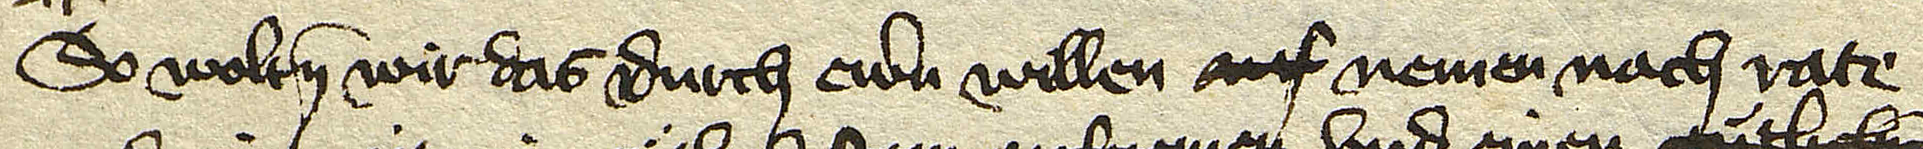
So woltn* wir das durch ew*n willen auf nemen nach rate
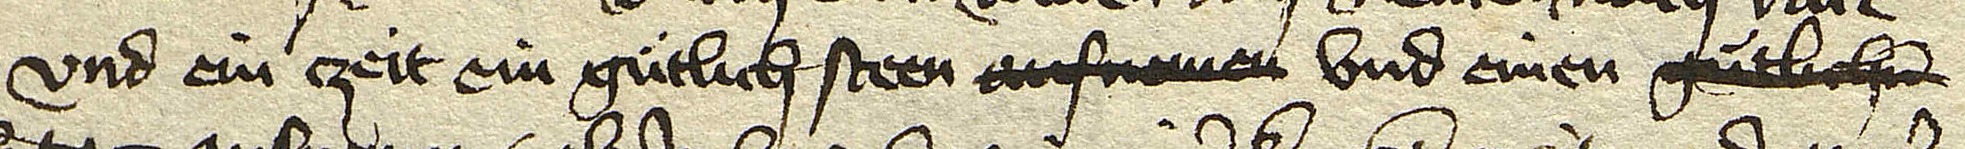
vnd ein cʒeit ein gütlich ſteen aufnemen vnd einen gütlichn*
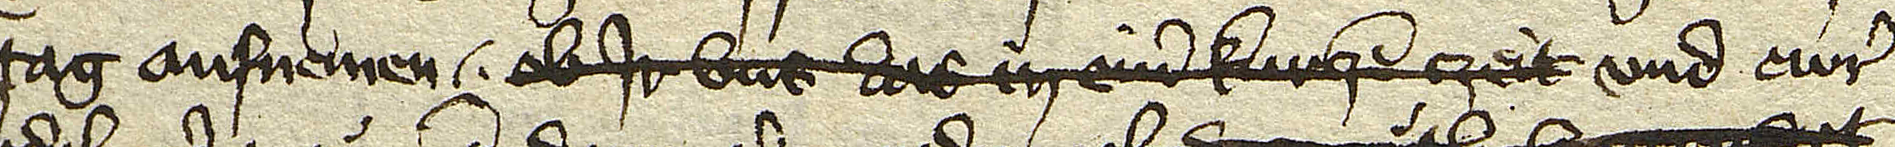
tag aufnemen / . ob Ir vns das in ein* kurcʒ* cʒeit vnd ewr*
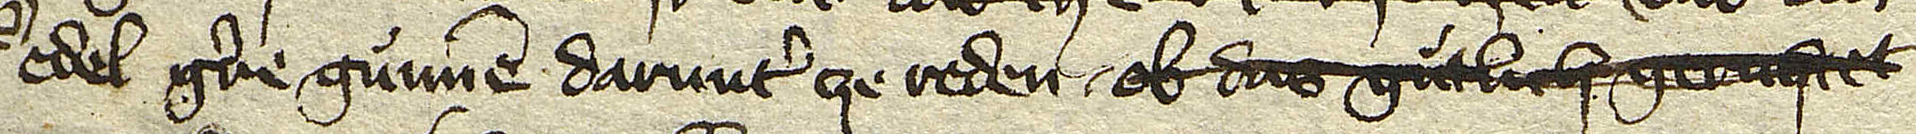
edel g*ne günne* darunt* cʒe reden / ob das gütllich gerichtet
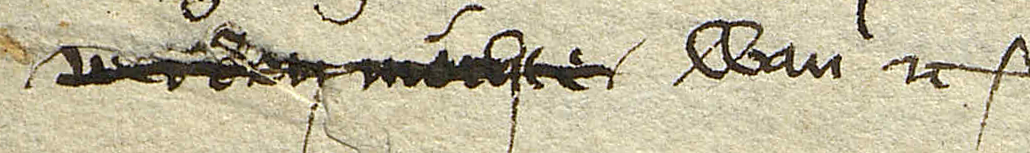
werden möchte / wan ec*
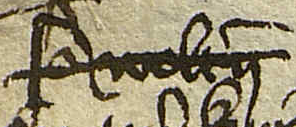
ſo woltn*
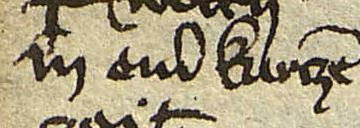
in ein* kurcʒe*
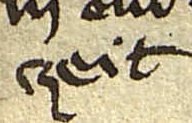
cʒeit
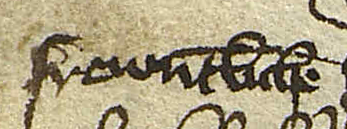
frewntliche*
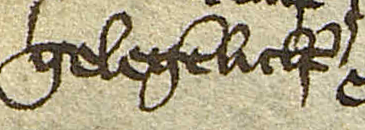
gelege*liche*
